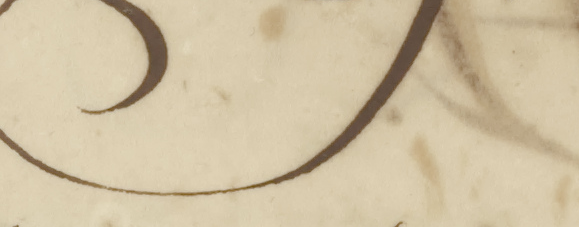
G
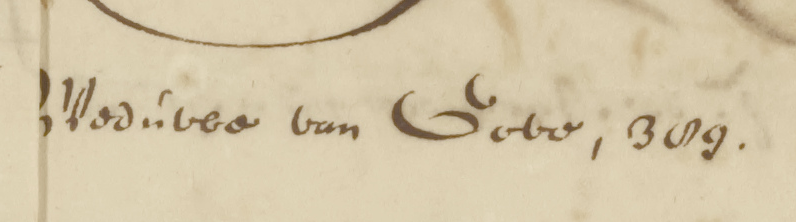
Weduwe van Gobe, 389.
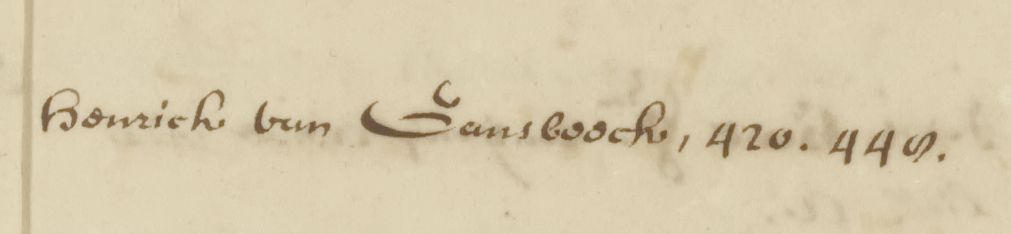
Henrick van Gansbeeck, 420. 448.
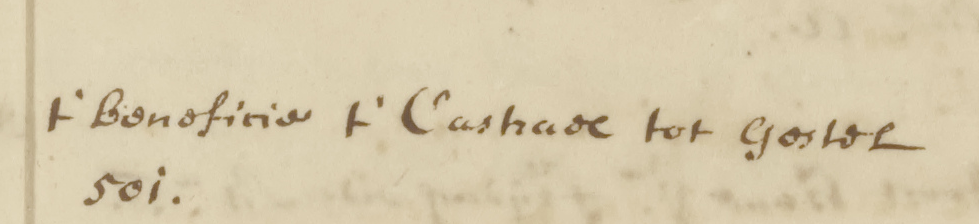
t' beneficie t' Castrael tot Gestel
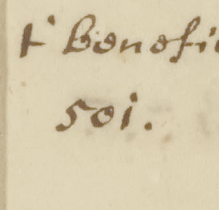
501.
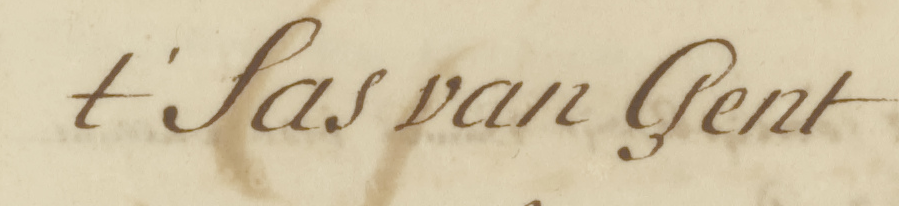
t' Sas van Gent
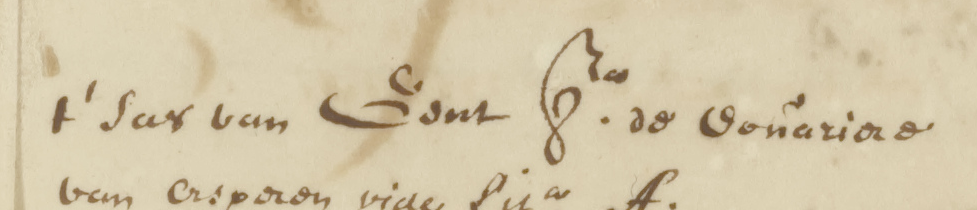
t' Sas van Gent ca. de Douariere
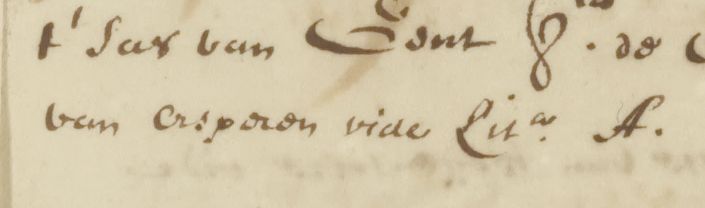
van Asperen vide Lita. A.
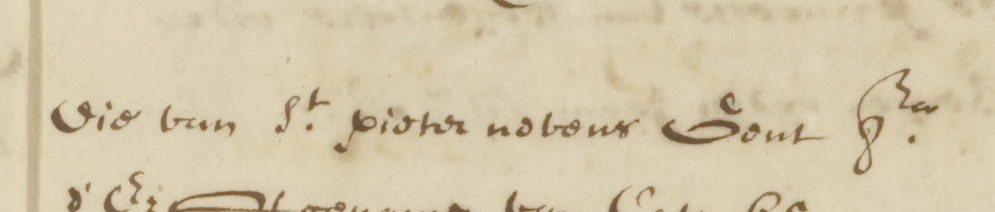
Die van St. Pieter nevens Gent ca.
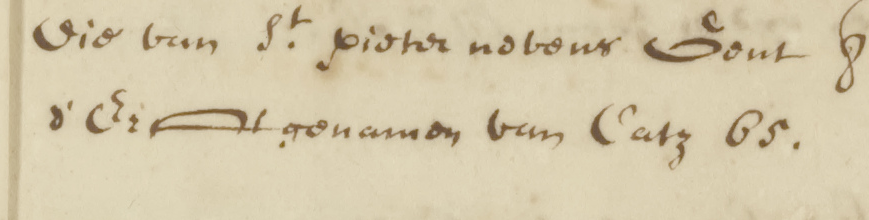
d'Erffgenamen van Catz 65.
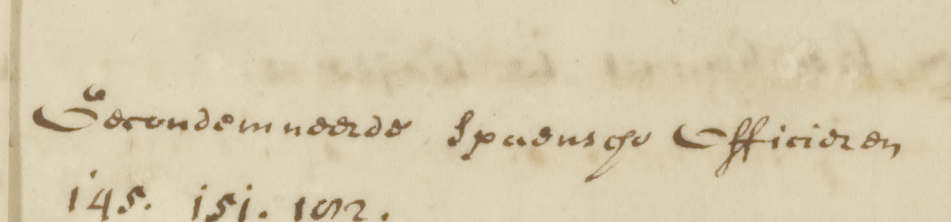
Gecondemneerde Spaensche Officieren
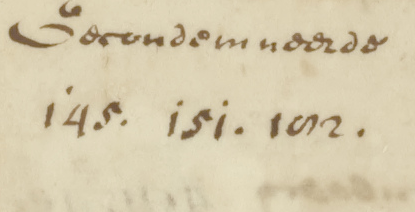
145. 151. 182.
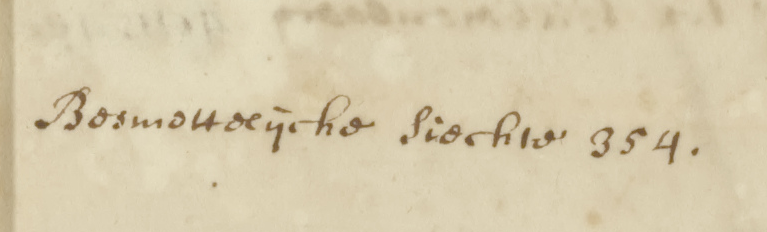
Besmettelijcke Sieckte 354.
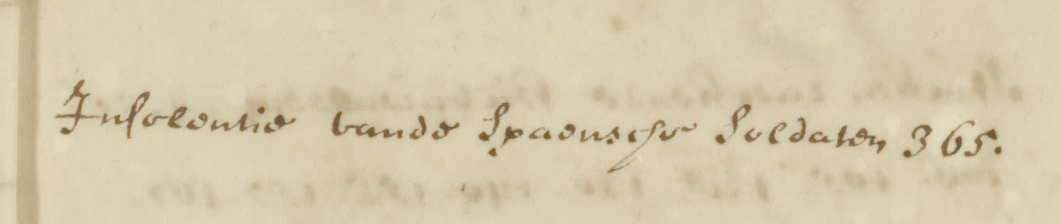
Insolentie vande Spaensche Soldaten 365.
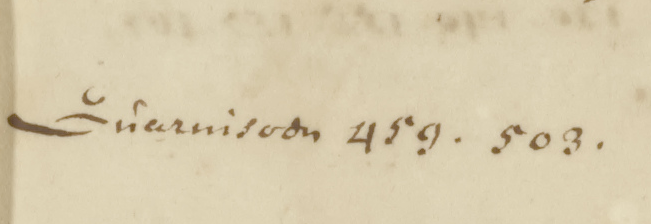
Guarnisoen 459. 503.
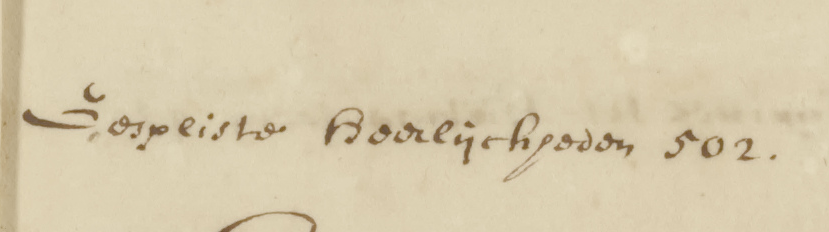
Gespliste Heerlijckheden 502.
